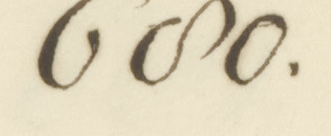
680.
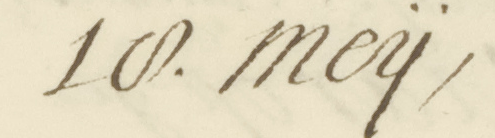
18. Meij.
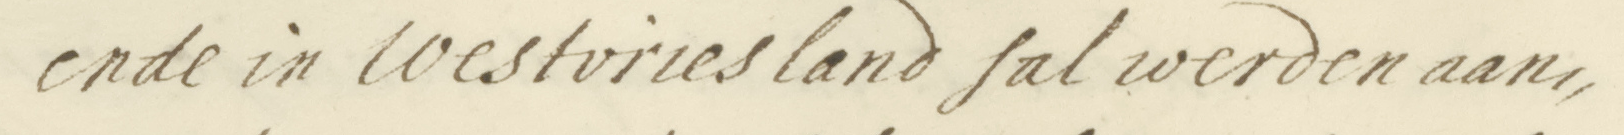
ende in westvriesland sal werden aan„
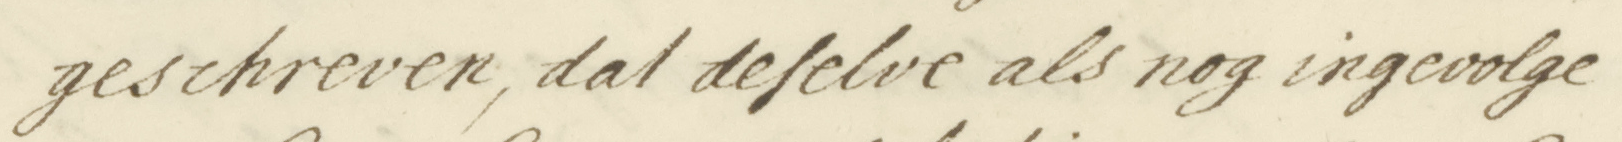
geschreven, dat deselve als nog ingevolge
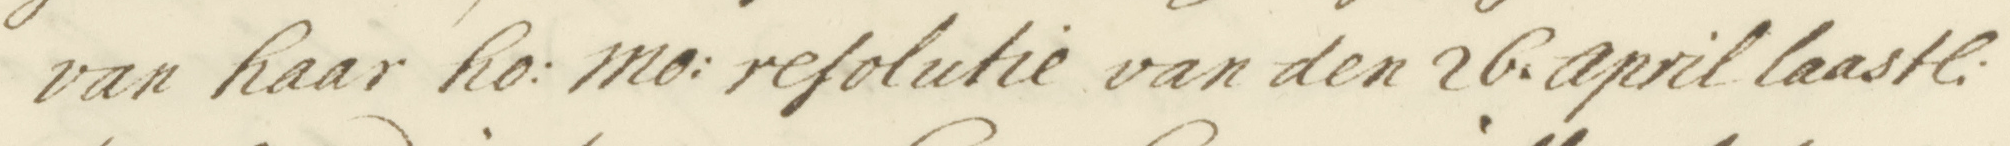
van haar ho:mo: resolutie van den 26. April laastl:
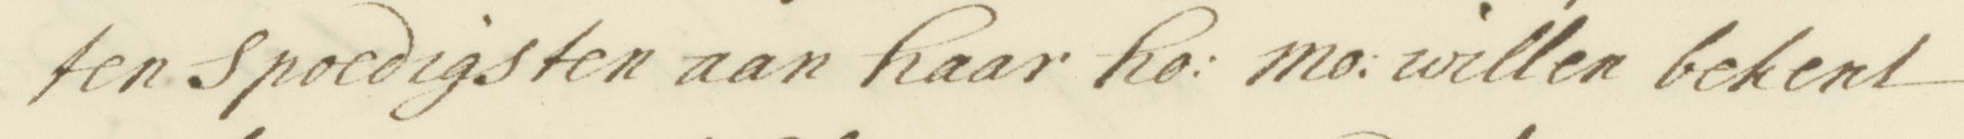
ten spoedigsten aan haar ho:mo: willen bekent
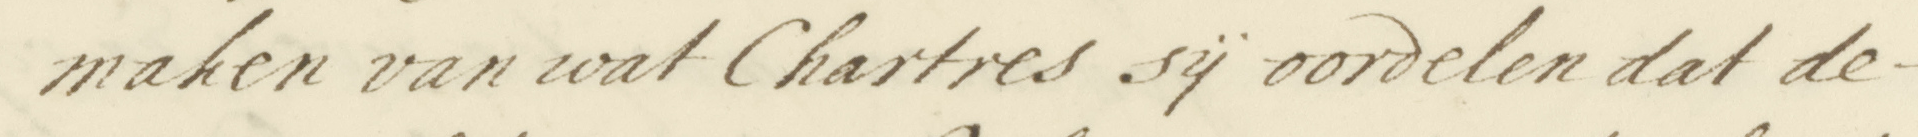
maken van wat Chartres sij oordelen dat de
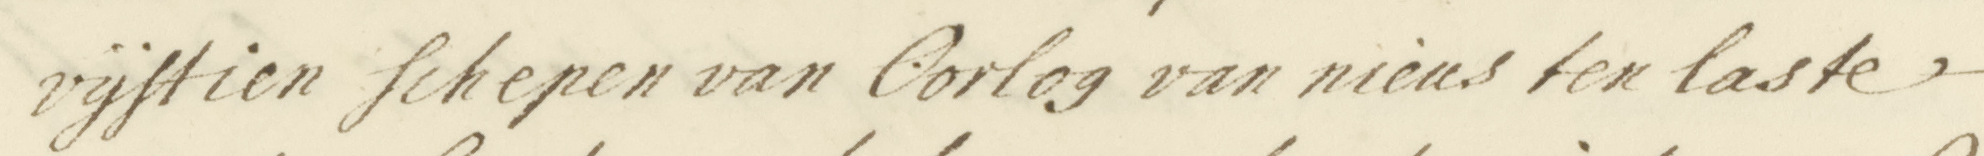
vijftien schepen van Oorlog van nieus ten laste
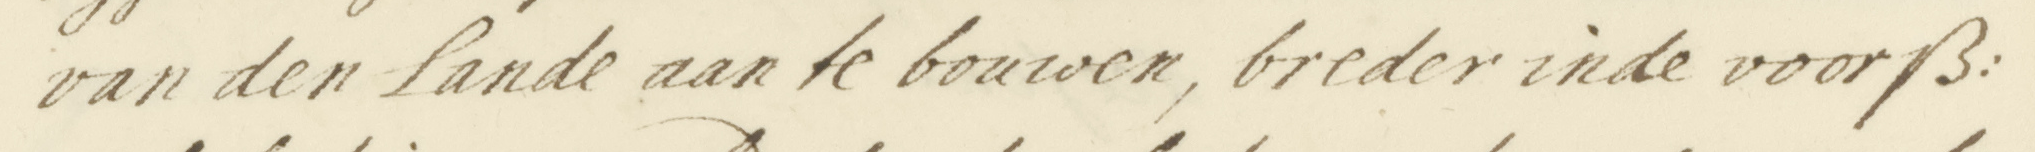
van den Lande aan te bouwen, breder inde voors:
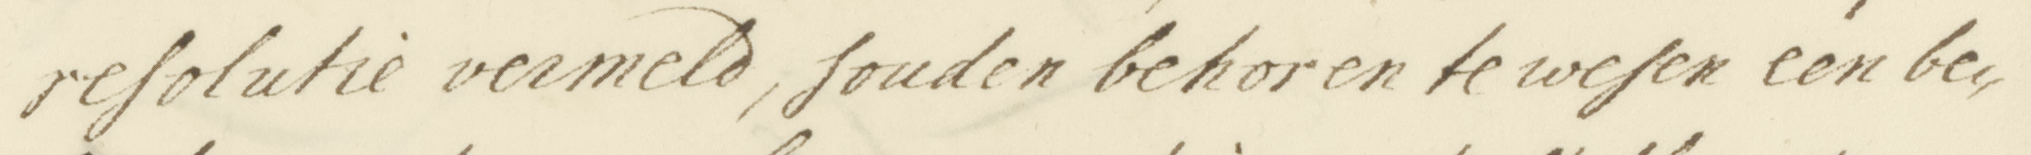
resolutie vermeld, souden behoren te wesen een be„
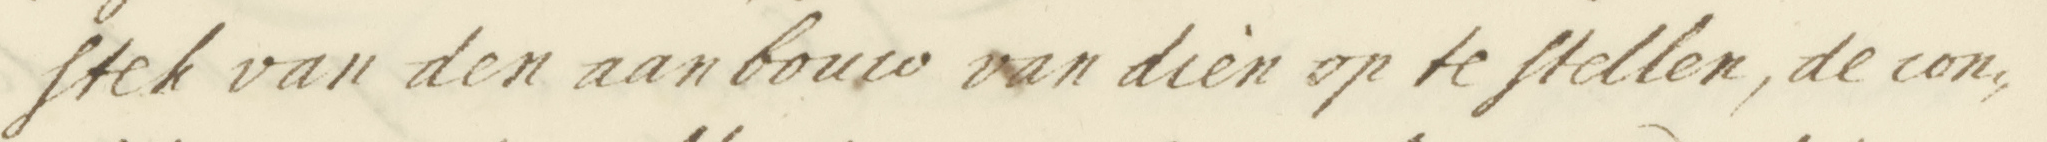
stek van den aanbouw van dien op te stellen, de con„,
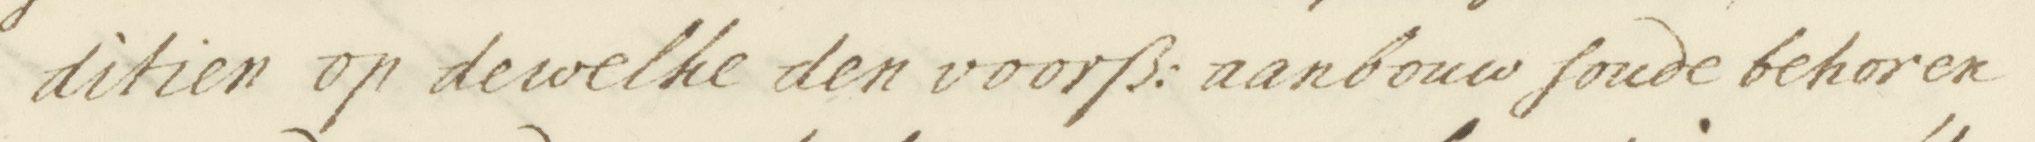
ditien op dewelcke den voors: aanbouw soude behoren
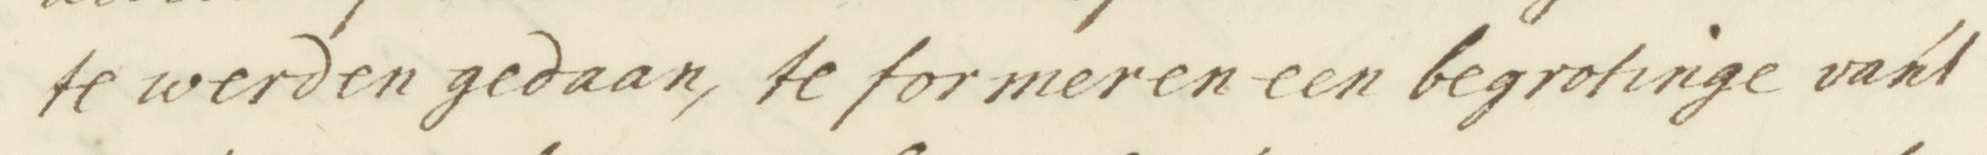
te werden gedaan, te formeren een begrotinge van't
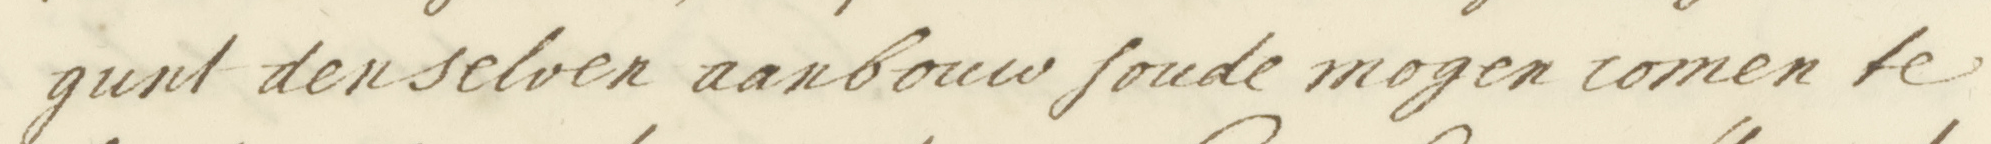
gunt denselven aanbouw soude mogen comen te
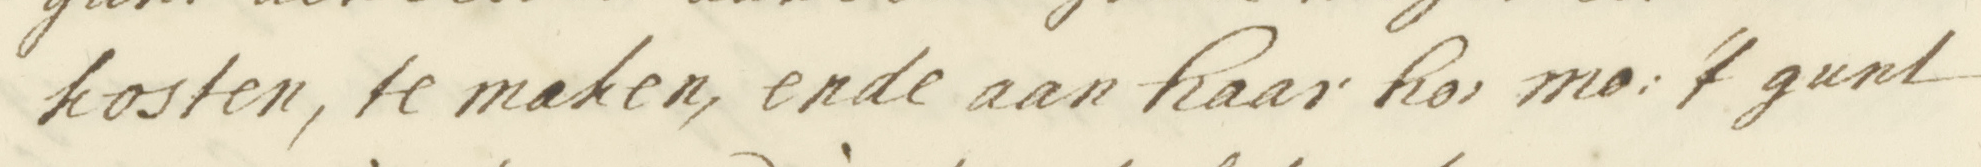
kosten, te maken, ende aan haar ho:mo: 't gunt
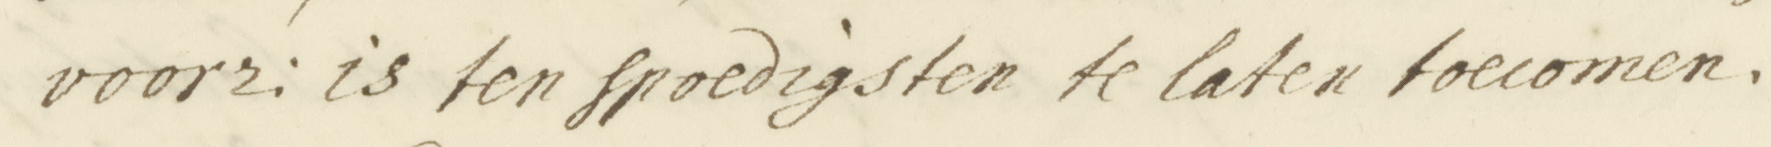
voors: is ten spoedigsten te laten toecomen.
